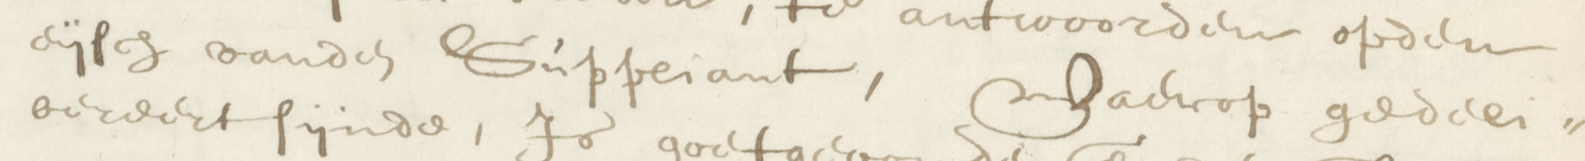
eijsch vanden Suppliant. Waerop gedeli„
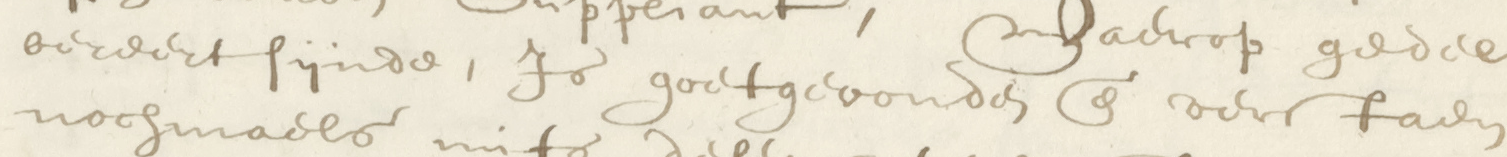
bereert sijnde, Is goetgevonden & verstaen,
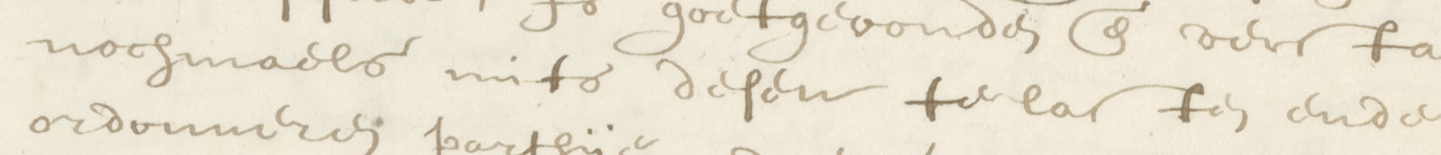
nochmaels mits desen te lasten ende
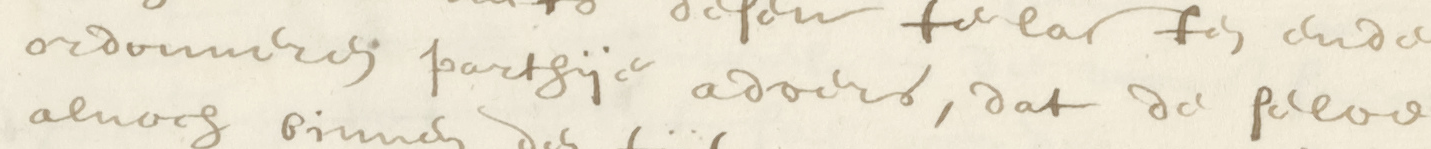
ordonneren parthije advers, dat de selve
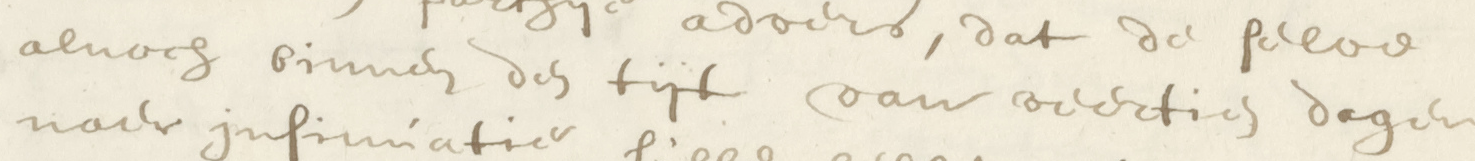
alnoch binnen den tijt van veertien dagen
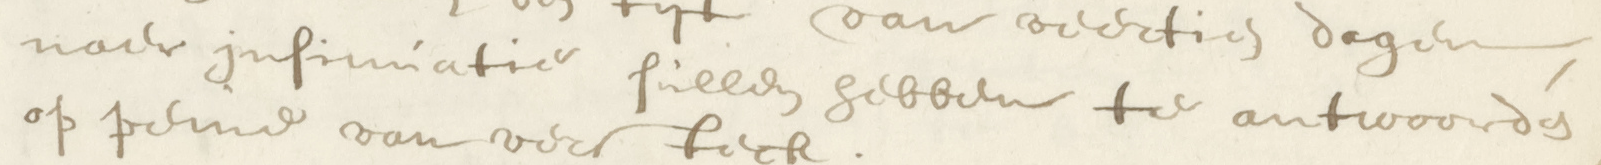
naer insinuatie sullen hebben te antwoorden
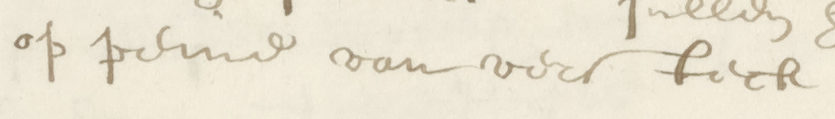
op peine van versteck.
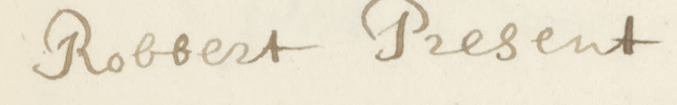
Robbert Present.
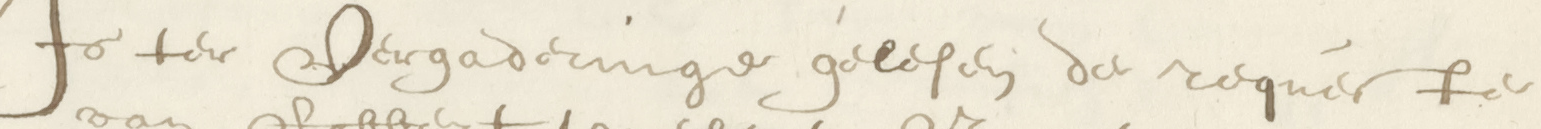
Is ter Vergaderinge gelesen de requeste
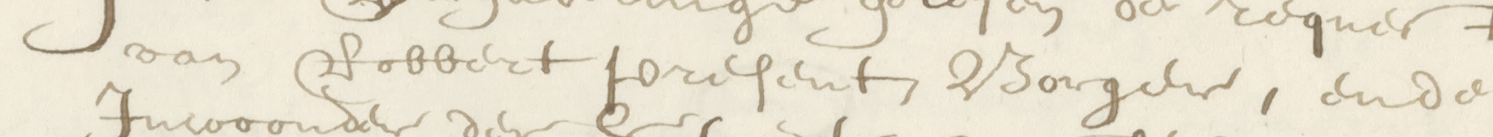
van Robbert Present, Borger, ende
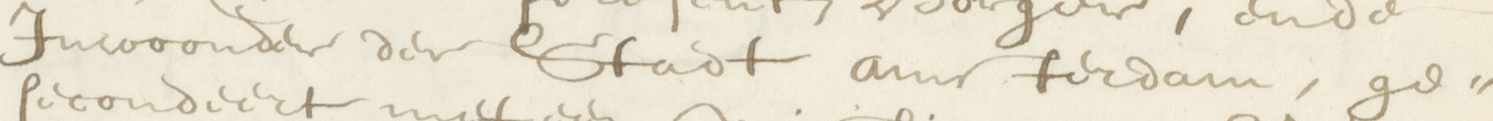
Inwoonder der Stadt Amsterdam, ge„
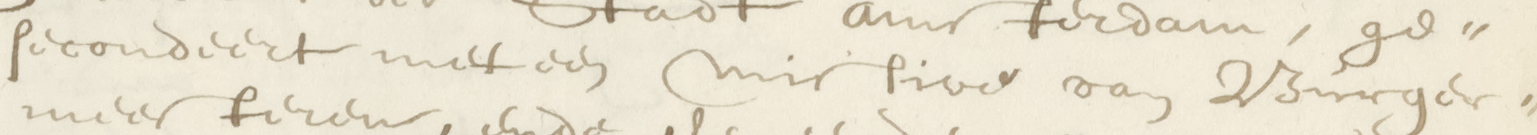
secondeert met een Missive van Burger„
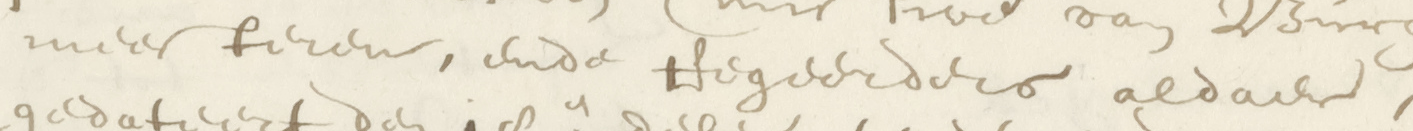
meesteren, ende Regeerders aldaer,
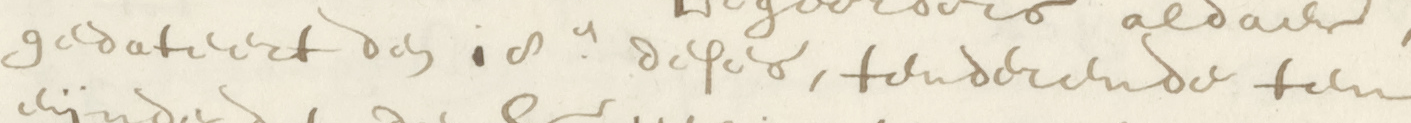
gedateert den 18e deses, tenderende ten
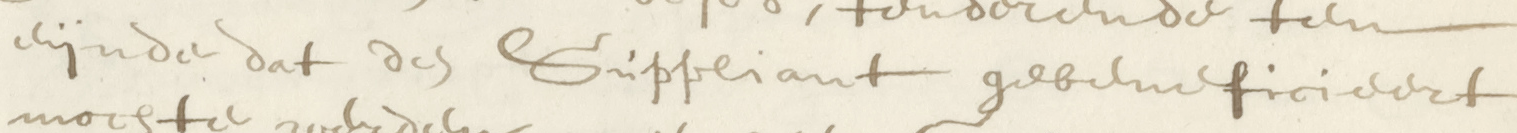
eijnde dat den Suppliant gebeneficieert
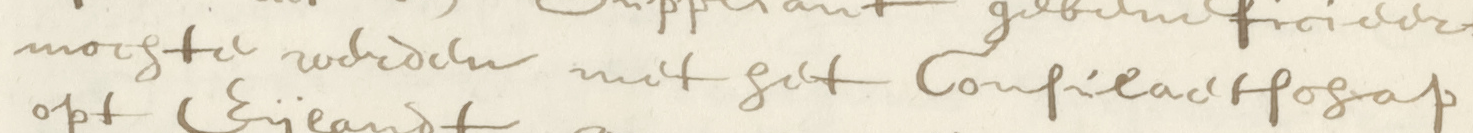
mochte werden met het Consulaetschap
